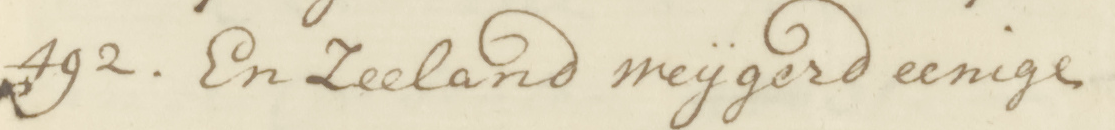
492. En Zeeland weijgerd eenige
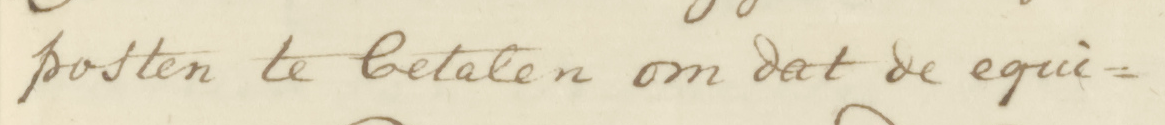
posten te betalen om dat de equi„
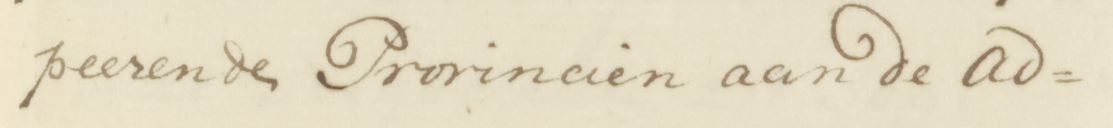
peerende Provincien aan de Ad„
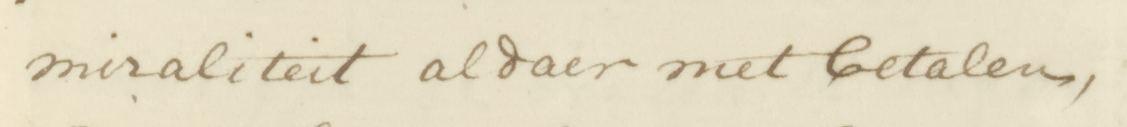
miraliteit aldaer niet betalen,
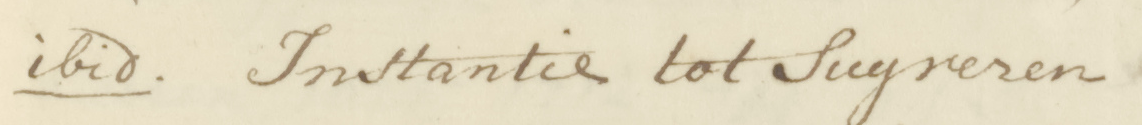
ibid. Instantie tot suyveren
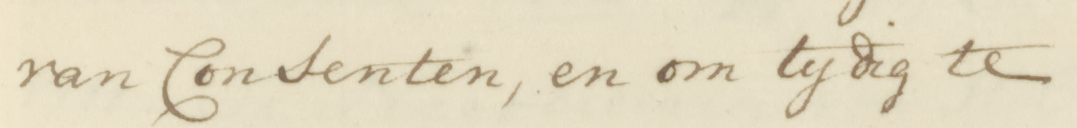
van consenten, en om tydig te
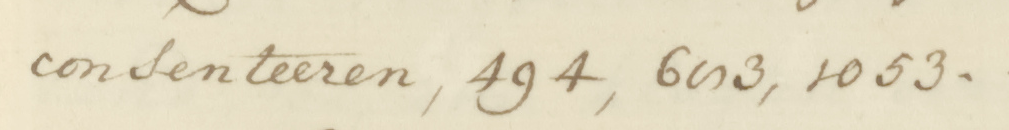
consenteeren, 494, 683, 1053. --
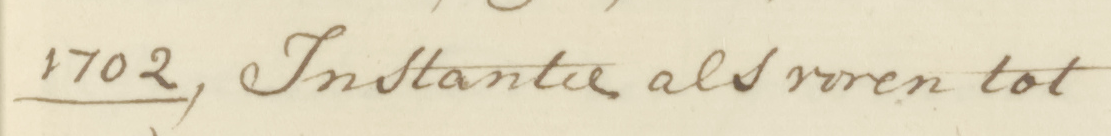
1702, Instantie als voren tot
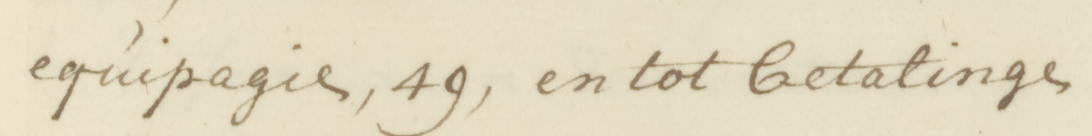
equipage, 49, ent tot betalinge
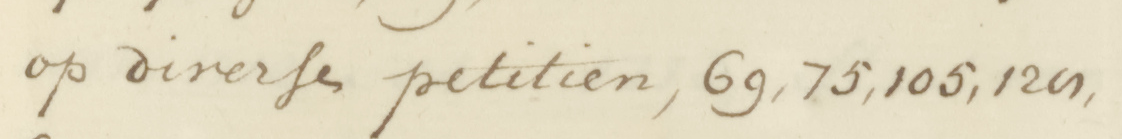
op diverse petitien, 69, 75, 105, 128,
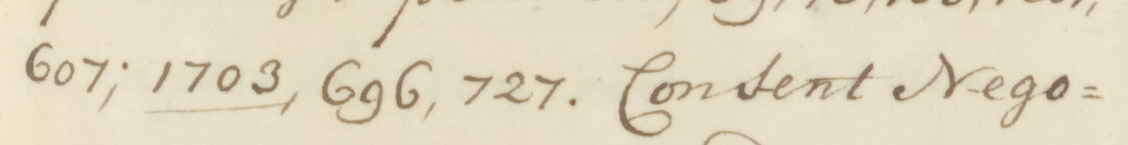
607; 1703, 696, 727. Consent nego„
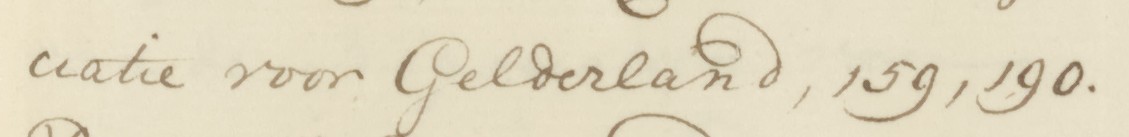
ciatie voor Gelderland, 159, 190.
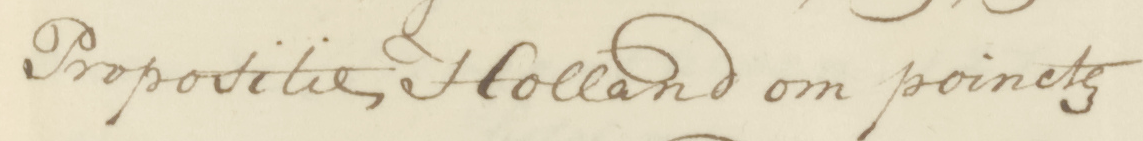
Propositie Holland om poincten
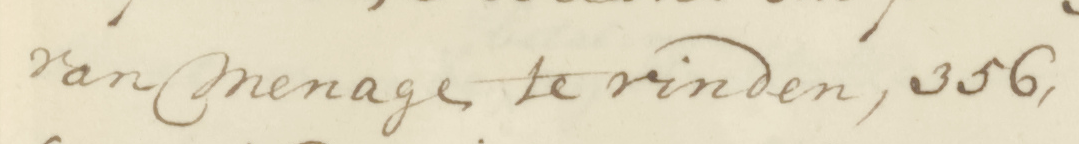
van menage te vinden, 356,
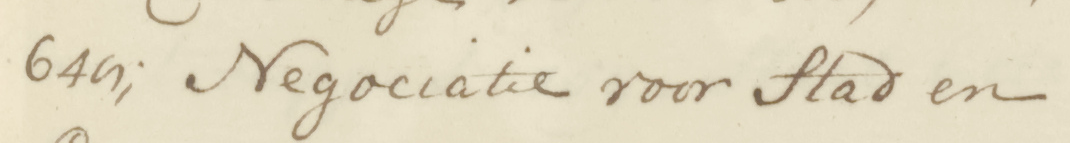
648; Negociatie voor Stad en
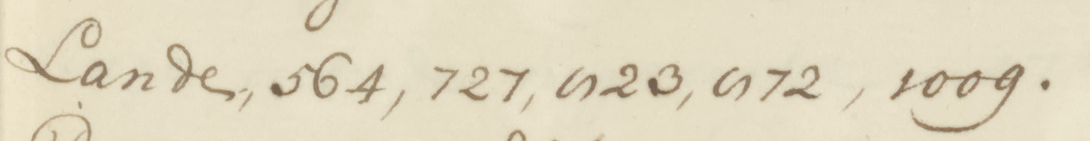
Lande 564, 727, 823, 872, 1009.
